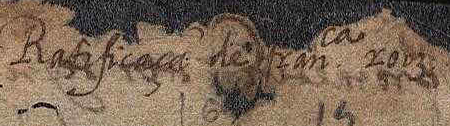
Ratificaçā de franca roiz
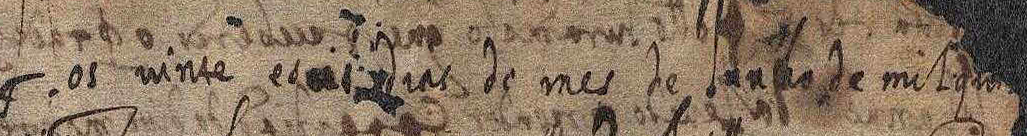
Aos uinte e seis dias do mes de Junho de mil qui
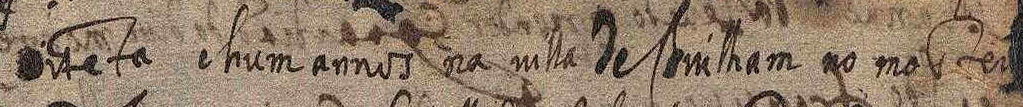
oitēta e hum annos na uilla de Couilham no mostei
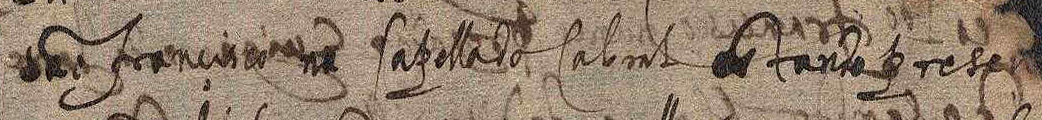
são françisco na Capella do Cabral estando presen
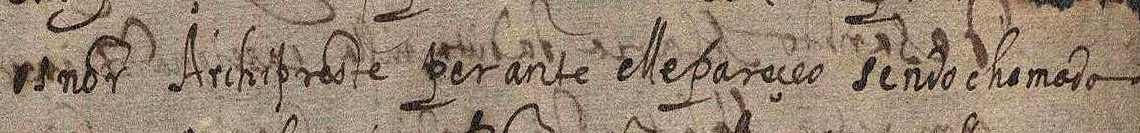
o snor̄ Archipreste perante elle pareçeo sendo chamada
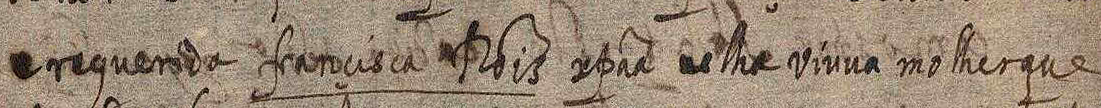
e requerida françisca Roīz xpaā uelha viuua molher que
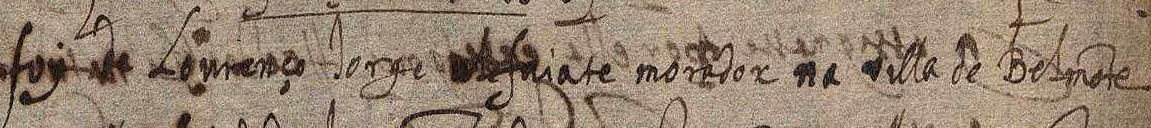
foy de Lourenço Jorge alfaiate morador na villa de Belmōte
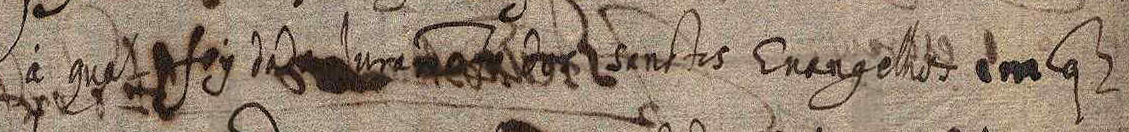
a qual foy dado Juramēto dos sanctos Euangelhos em q̄
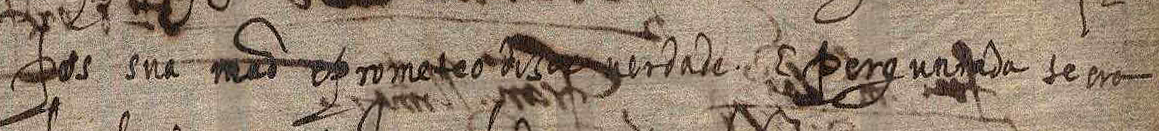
pos sua mão e prometeo dizer uerdade. E perguntada se era
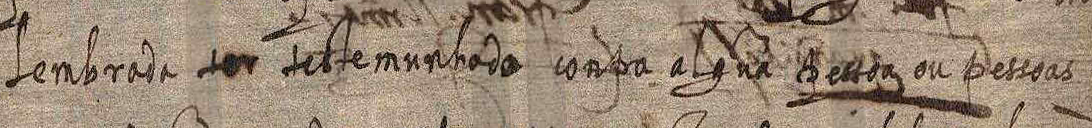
lembrada ter testemunhado contra algūa pessoa ou pessoas
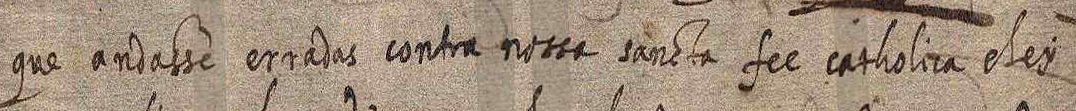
que andassē erradas contra nossa sancta fee catholica e ley
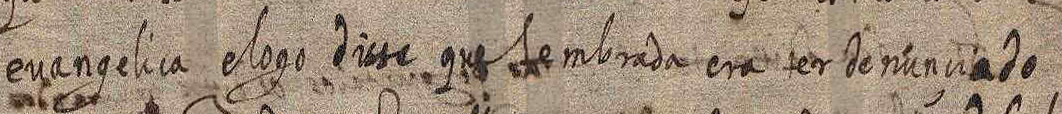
euangelica e logo disse que lembrada era ter denunçiado
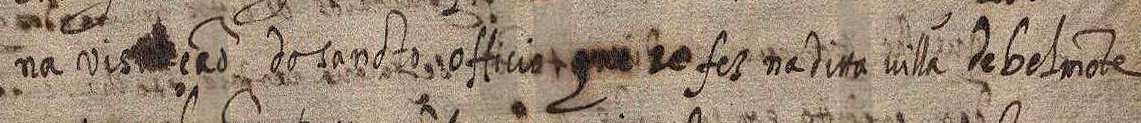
na visi_ção do sancto officio que se fez na ditta uilla de belmōte
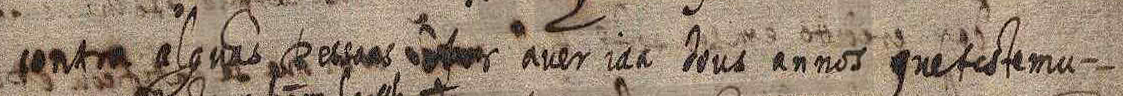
contra alguās pessoas e por auer iaa dous annos que testemu
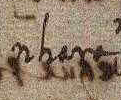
nhara
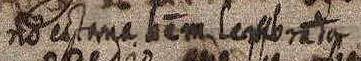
nō estaua bēm lembrada
